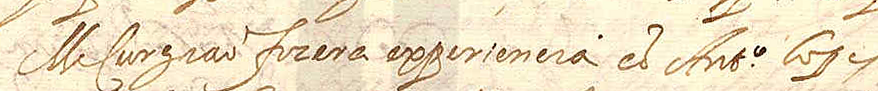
elle Curgiaõ fizera experiencia cō Anto lopes
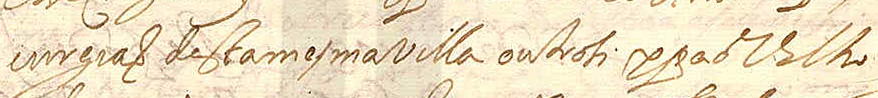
curgiaõ desta mesma villa outrosi xpaõ E lho
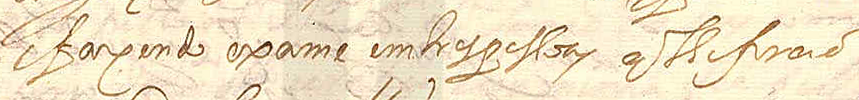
e fazendo exame em tres pessoas q̄ lhe foraõ
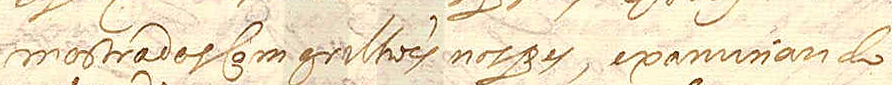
mostradas Com grilhoẽs nos pes, examinando
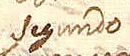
segundo
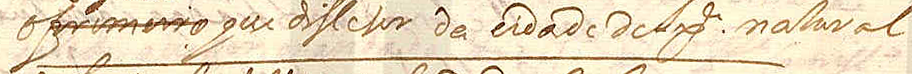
o primeiro que disse ser da cidade de Lx.a natural
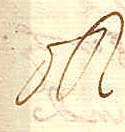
o R
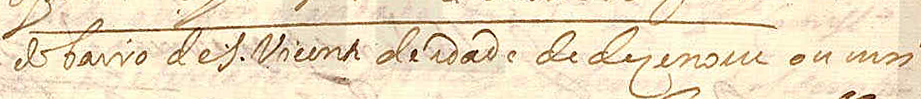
do bairo de S. Vicente de idade de dezenoue ou uin
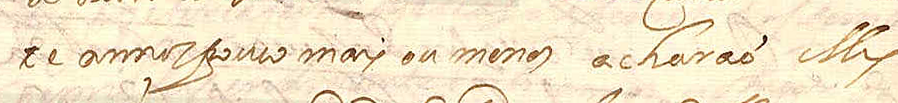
te annos pouco mais ou menos acharaõ elles
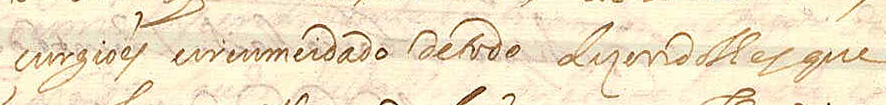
curgioẽs circumcidado de todo dizendolhes que
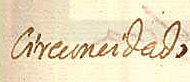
circuncidado
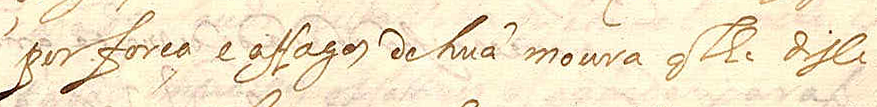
por força e affagos de huā moura q̄ lhe disse
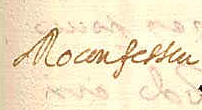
o Ro confessou
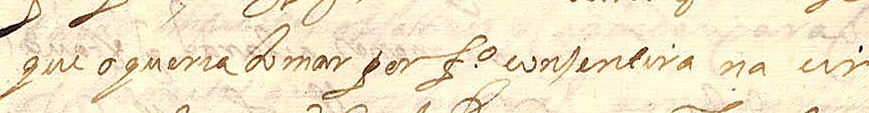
que o queria tomar por f.o consentira na cir
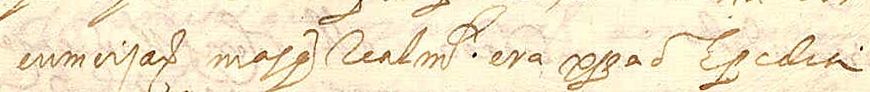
cumcizaõ mas q̄ Realm.te era xpaõ E pedia
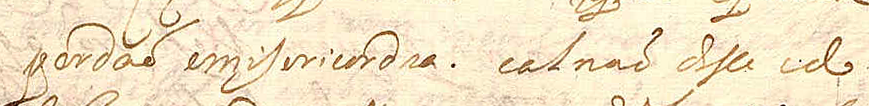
perdaõ e misericordia. e al naõ disse e do
